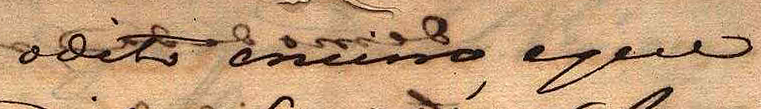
o dito encino, e que
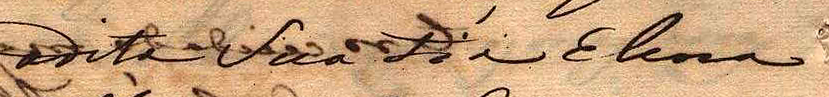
a dita Sua Tia Elena
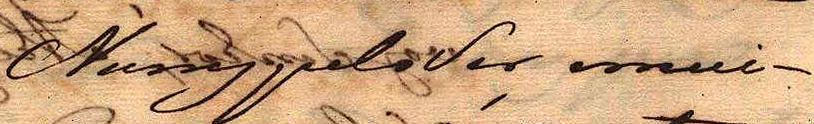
Nunes pelo Ser, e mui
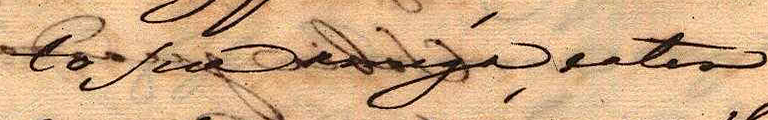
to sua amiga, e a ter
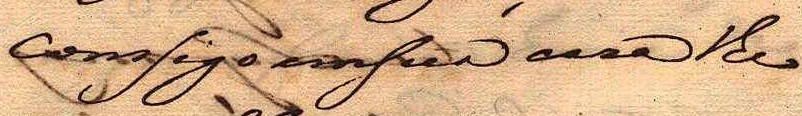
comsigo em sua caza lhe
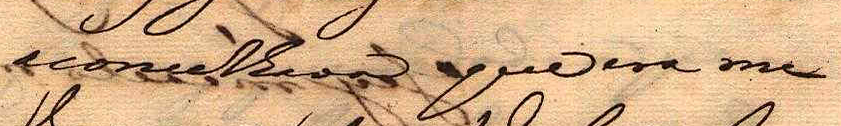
aconcelhava que era me
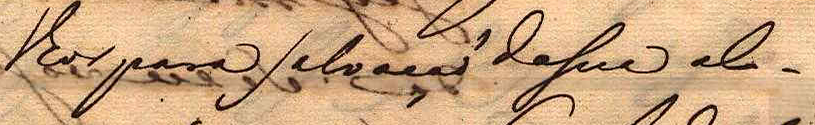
lhor para salvaçaõ da sua al
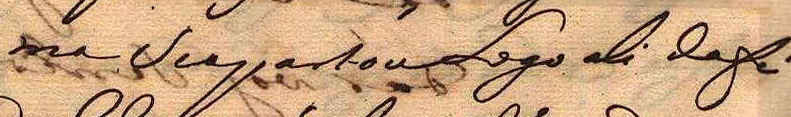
ma se apartou Logo ali da fé
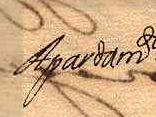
Apartam.to
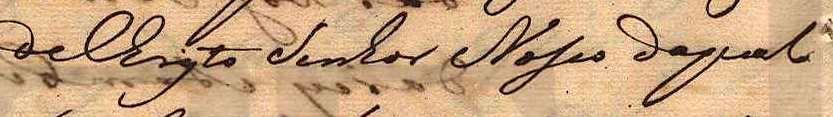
de Christo Senhor Nosso da qual
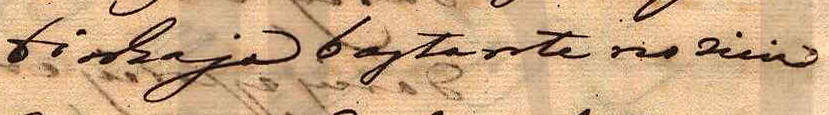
tinha ja bastante noticia
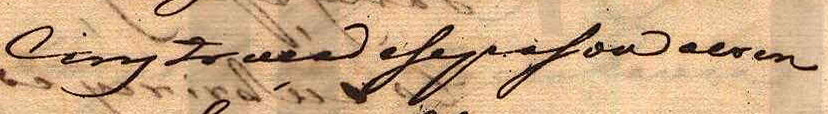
e instruçaõ e se pasou a cren
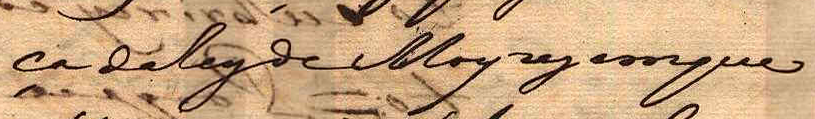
ça da ley de Moyzes em que
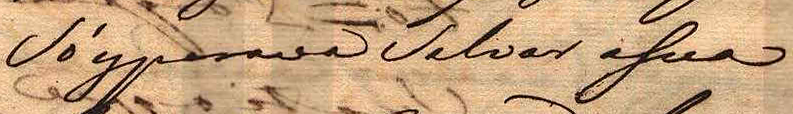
Só esperava Salvar a sua
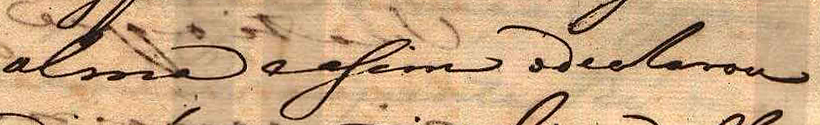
alma, e asim o declarou
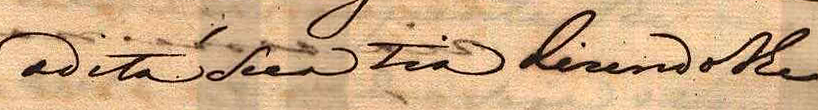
a dita sua tia dizendolhe
